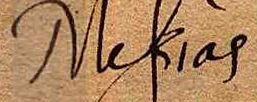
Messias
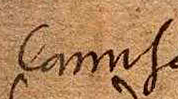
Camisa
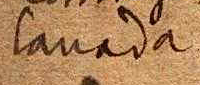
lauada
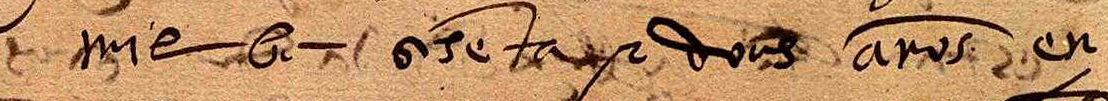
mil bc sesēta e dous an̄os en
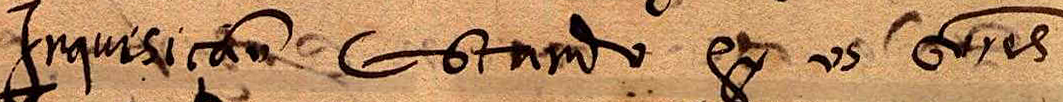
Jnquisiçaõ Estando hy os sōres
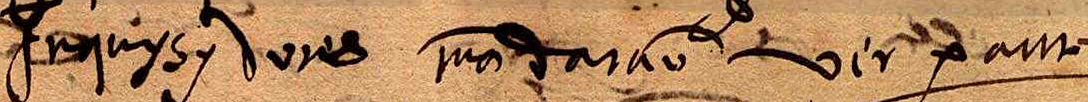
Jnquysydores mādaraõ vir ꝑante
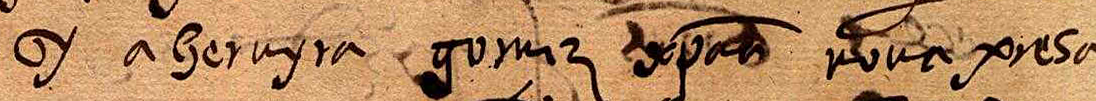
sy a heruyra gomez xpāa noua presa
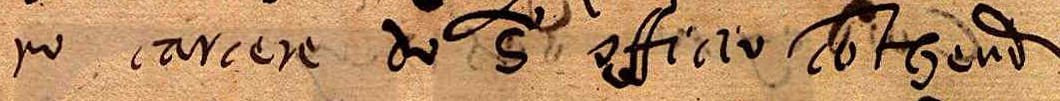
no carcere do Sto officio cōtheudo
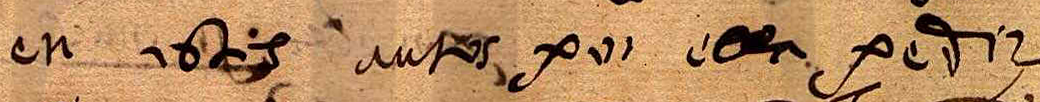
en estes autos por ella pedir
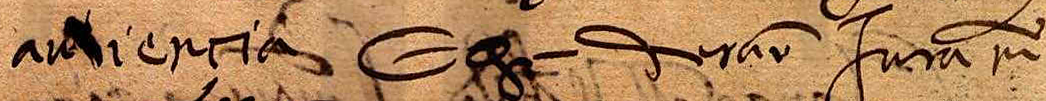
audiencia E lhe deraõ Juramto
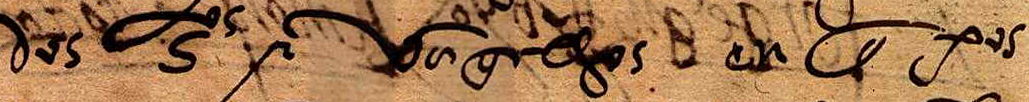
dos Stos evāgelhos en q̄ pos
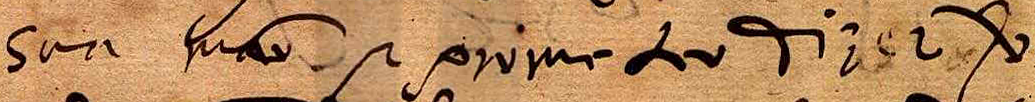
sua maõ e prometeo dizer ꝟ
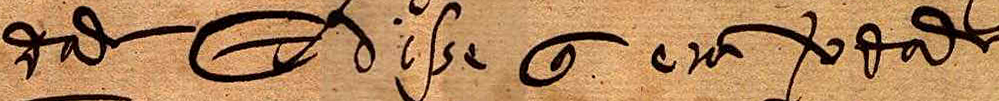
dade E dise q̄ era ꝟdade
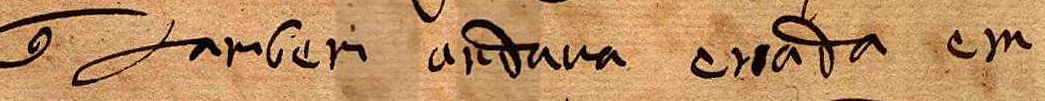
q̄ tambem andaua errada em
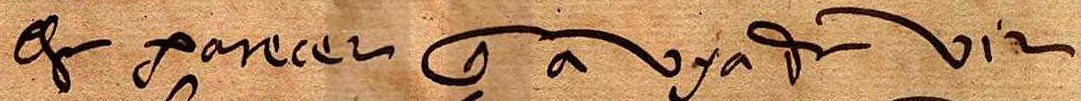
lhe parecer q̄ avya de vir
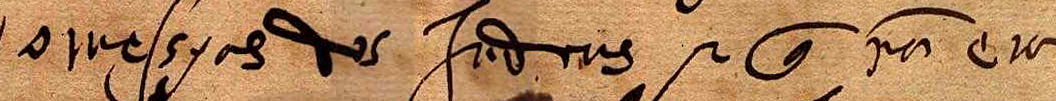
o messyas dos Judeus e q̄ nā era
